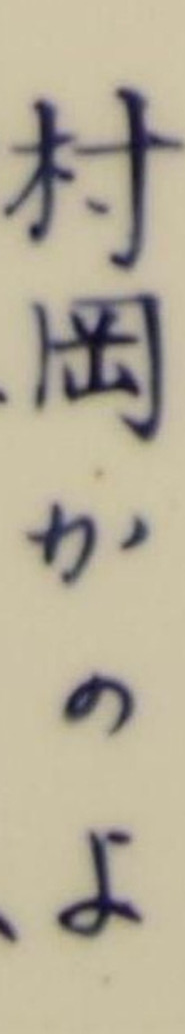村岡かのよ
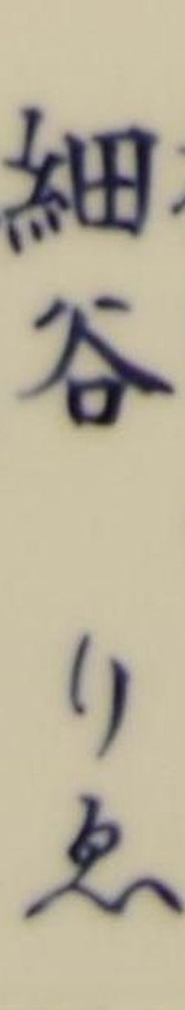細谷りゑ
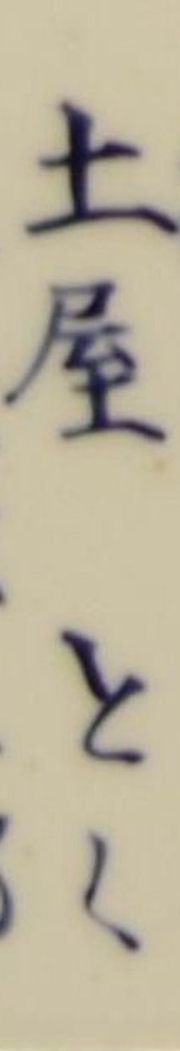土屋とく
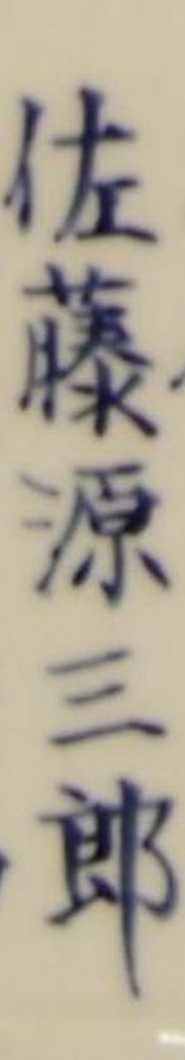佐藤源三郎
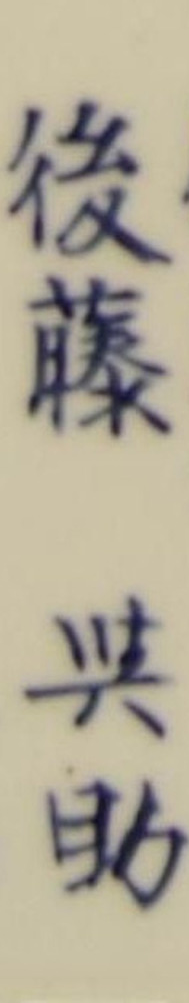後藤與助
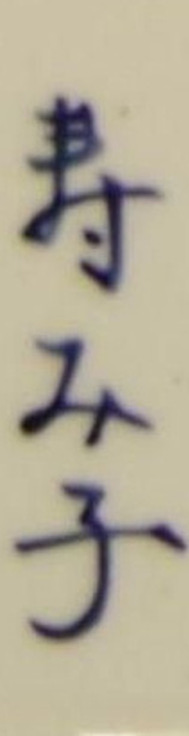寿み子
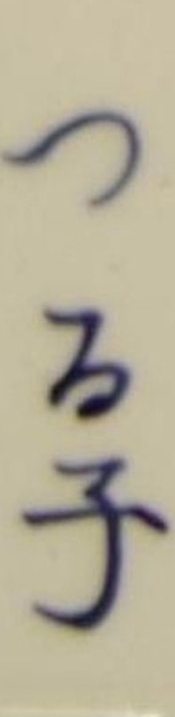つる子
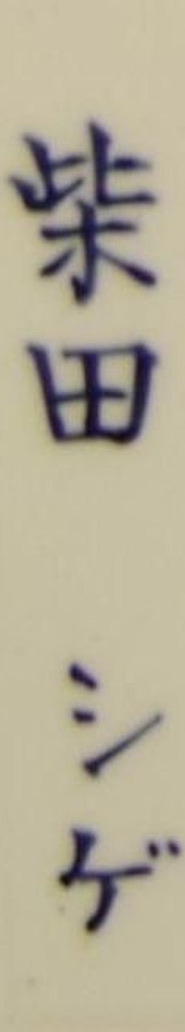柴田シゲ

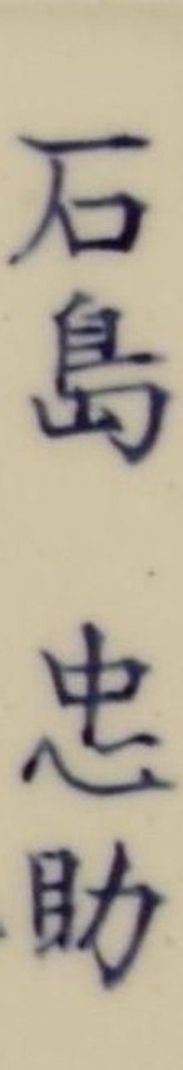石島忠助
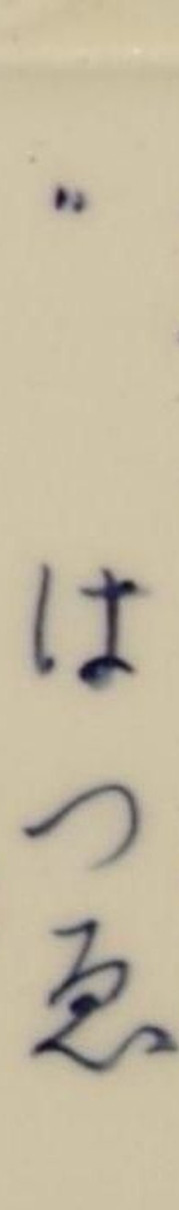はつゑ
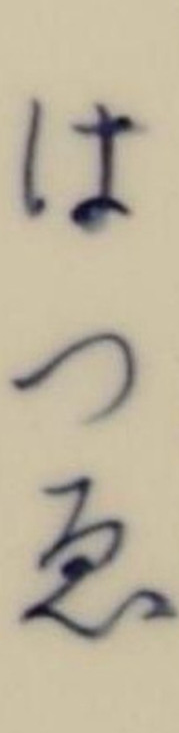はつゑ
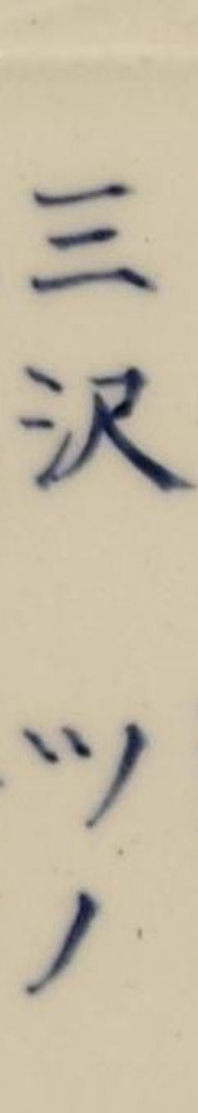三沢ツノ
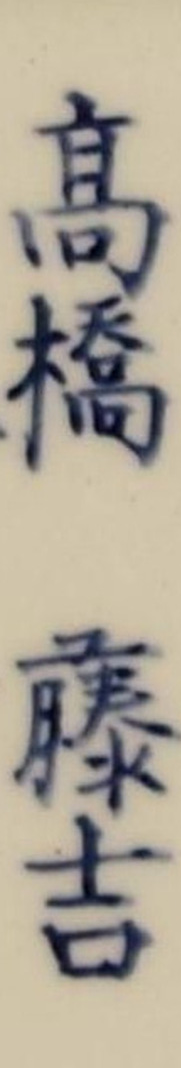高橋藤吉
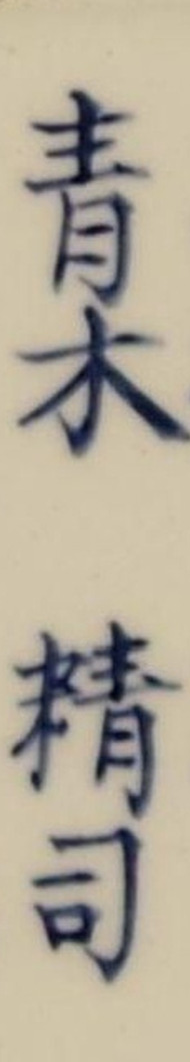青木精司
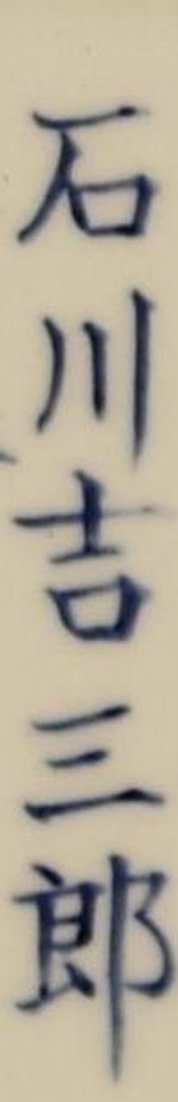石川吉三郎
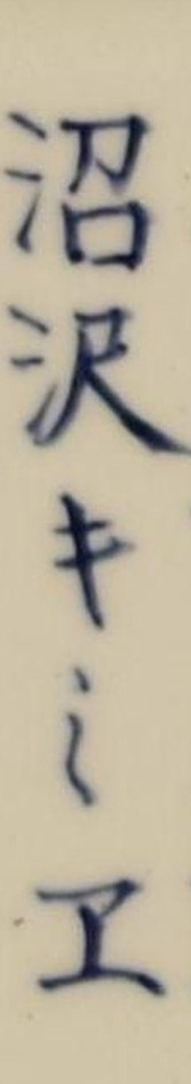沼沢キミエ
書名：A~D
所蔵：koyasan kongobuji
